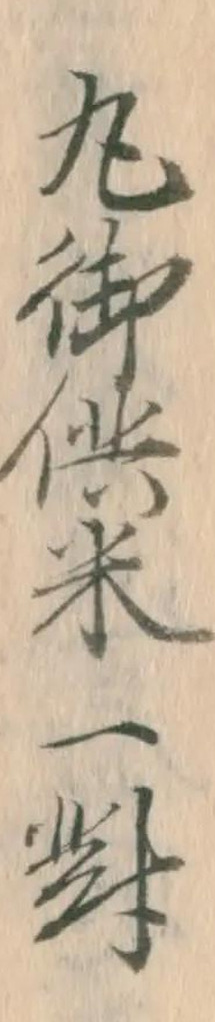丸御供米一対
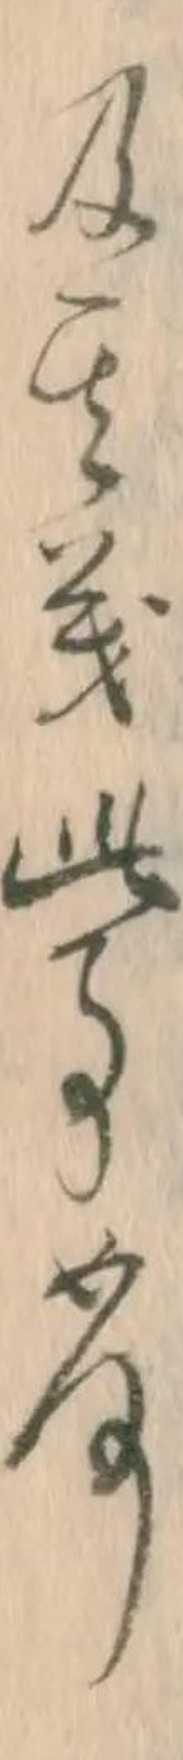及其義此事如何
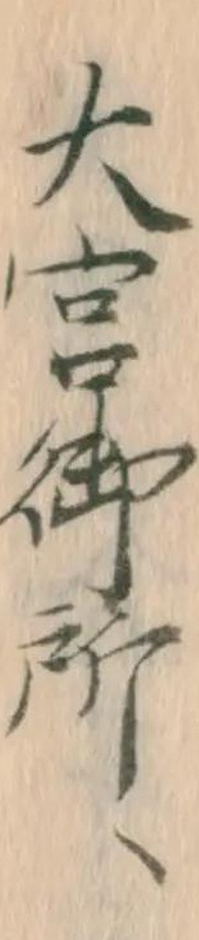大宮御所へ
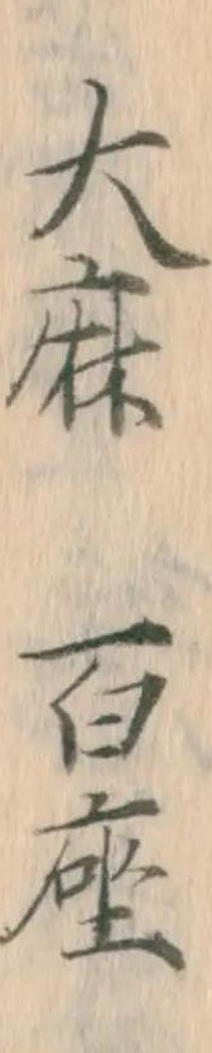大麻百座
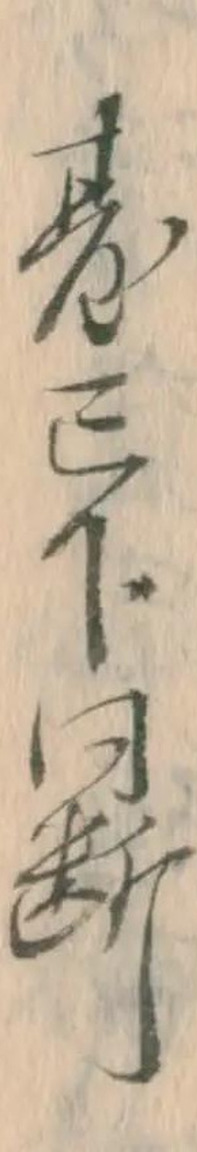臺已下同断
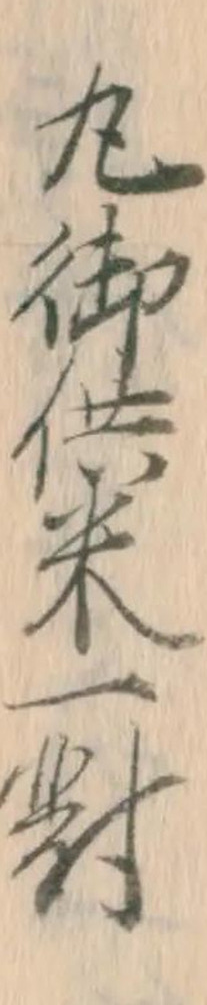丸御供米一対
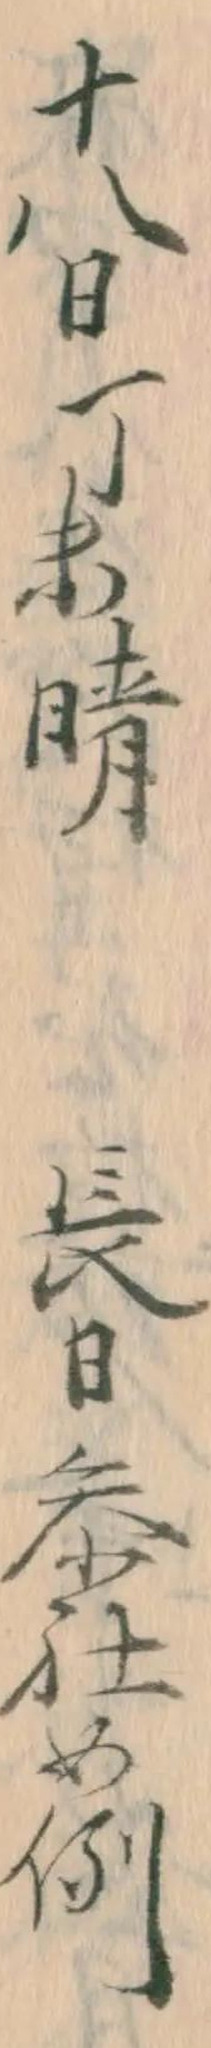十八日丁未晴長日参社如例
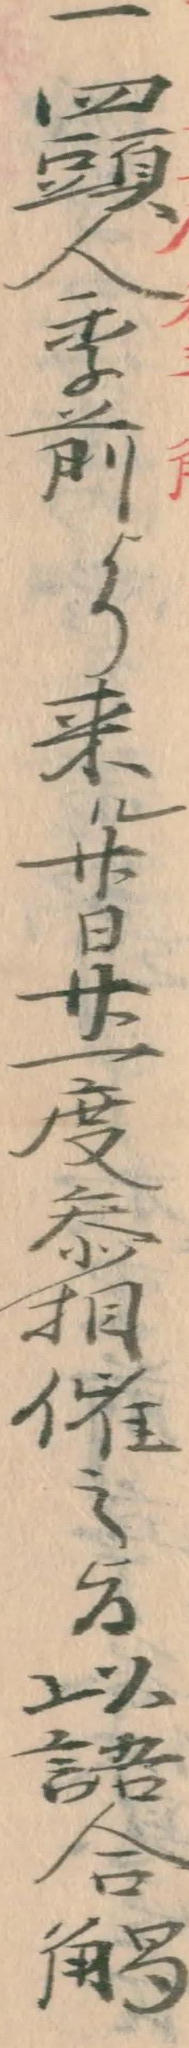一四頭人季前より来ル廿日廿一度参相催之旨以語合觸
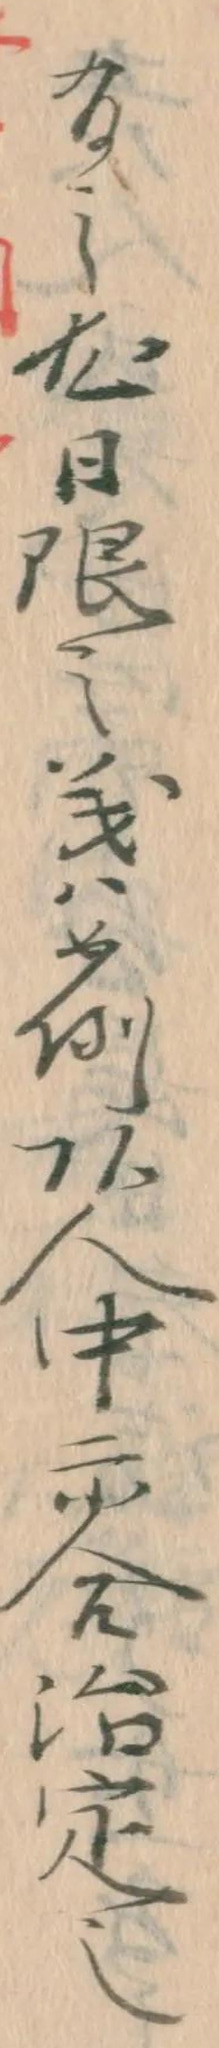有之尤日限之義ハ如例頭人中示合治定也
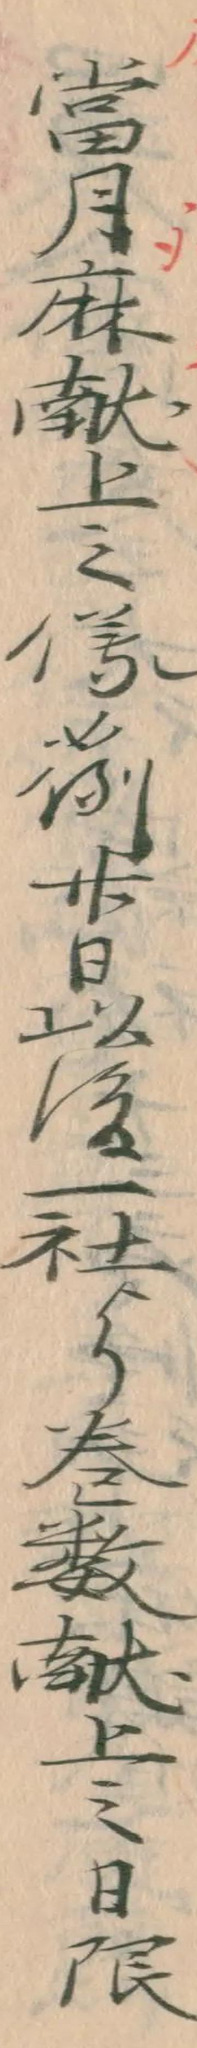一當月麻献上之儀如例廿日以後一社より巻数献上之日限
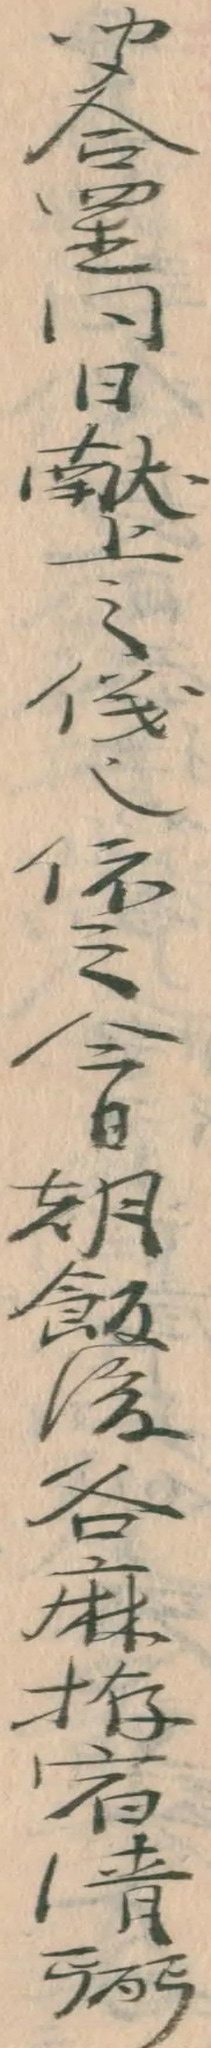聞合置同日献上之儀也依之今日朝飯後各麻拵宿清弼
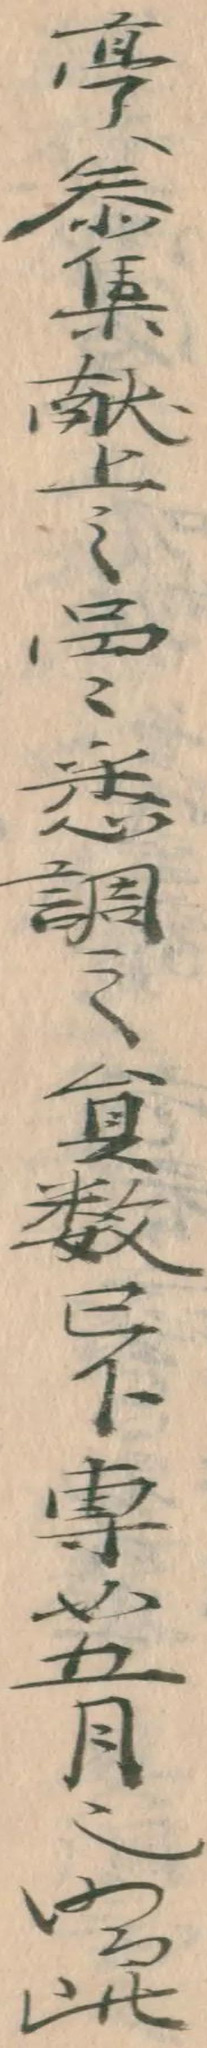亭へ参集献上之品々悉調之員数已下専如五月也仍而此
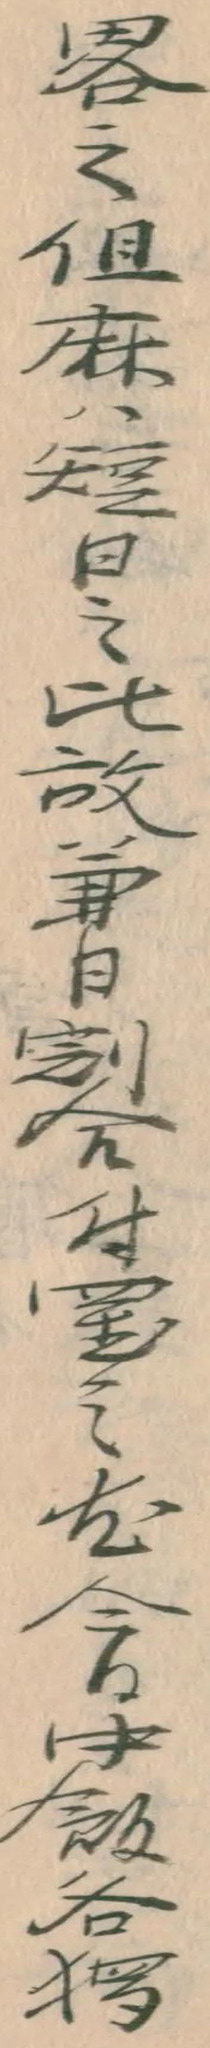畧之但麻ハ短日之比故兼日割合付置之尤今日中飯各獨
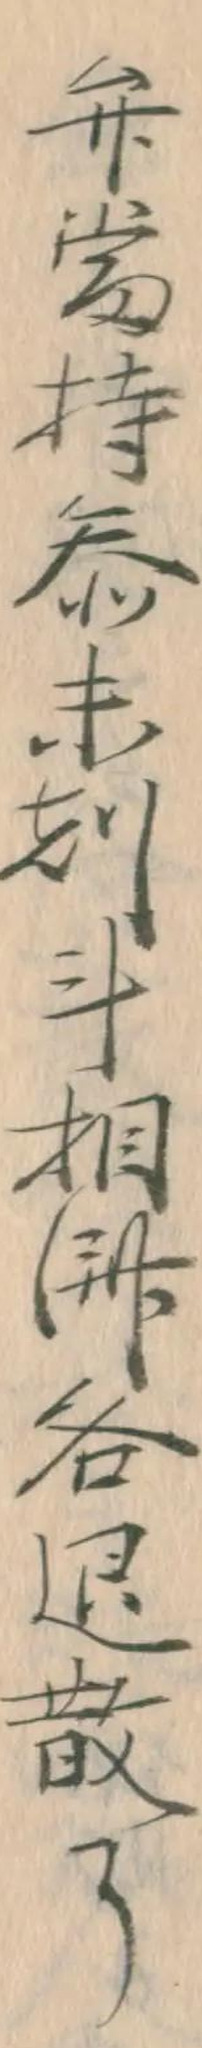弁當持参未刻斗相済各退散了
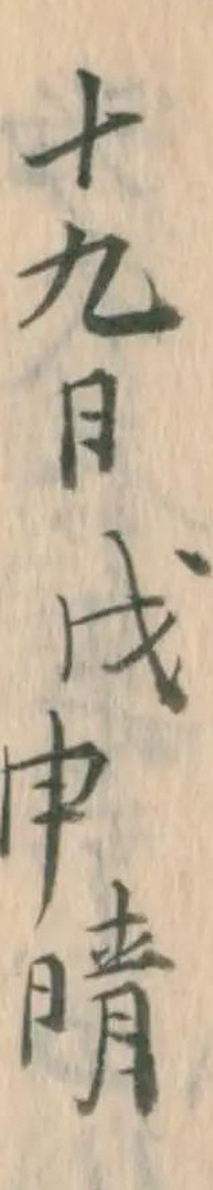十九日戊申晴
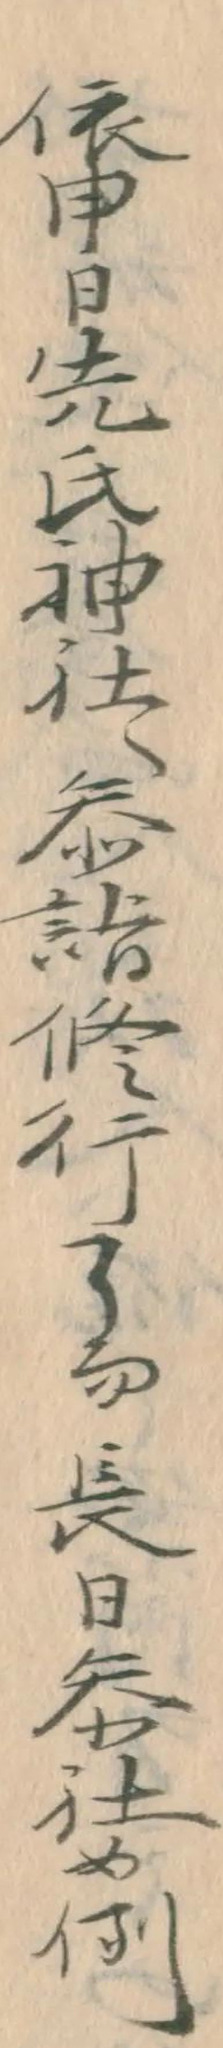一依申日先氏神社へ参詣修行了而長日参社如例
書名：賀茂社記録. 第74冊
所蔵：国立国会図書館 National Diet Library, JAPAN
